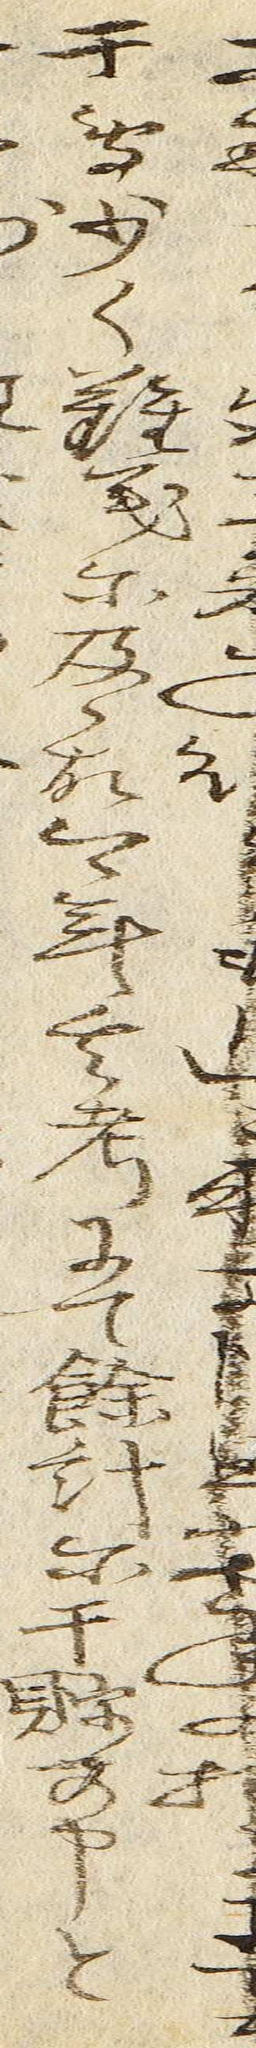干鳥少く難義に及候故今年其考にて余計に干貯可申と
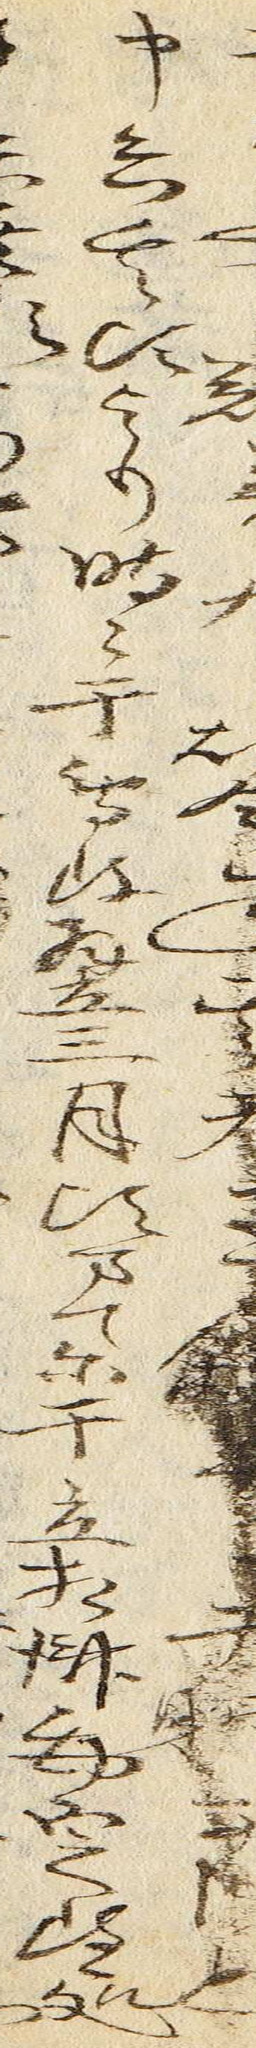申合其頃より時々干鳥致翌三月頃まてに干立相済勘定致候処
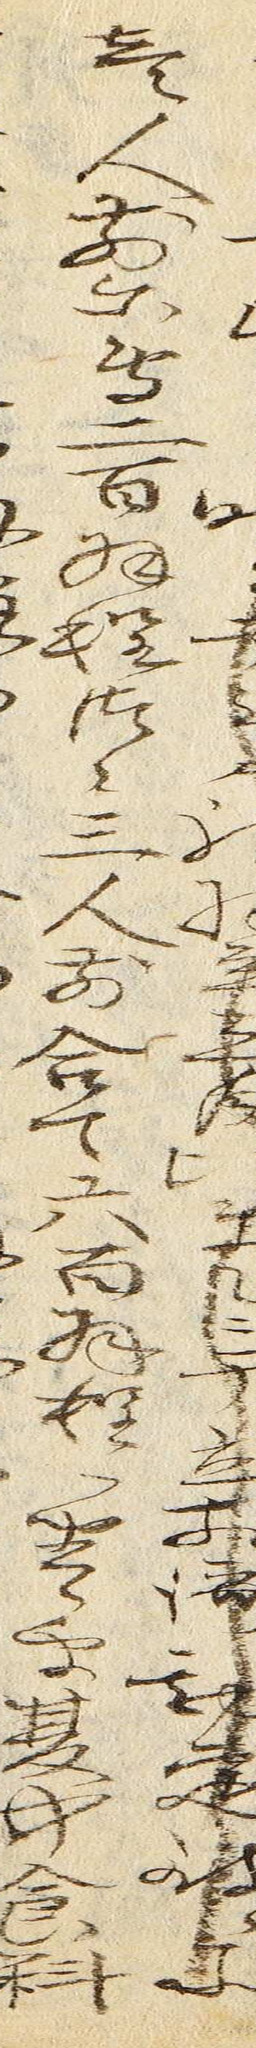壱人前に鳥二百羽程つゝ三人前合て六百羽程御座候を夏中食料
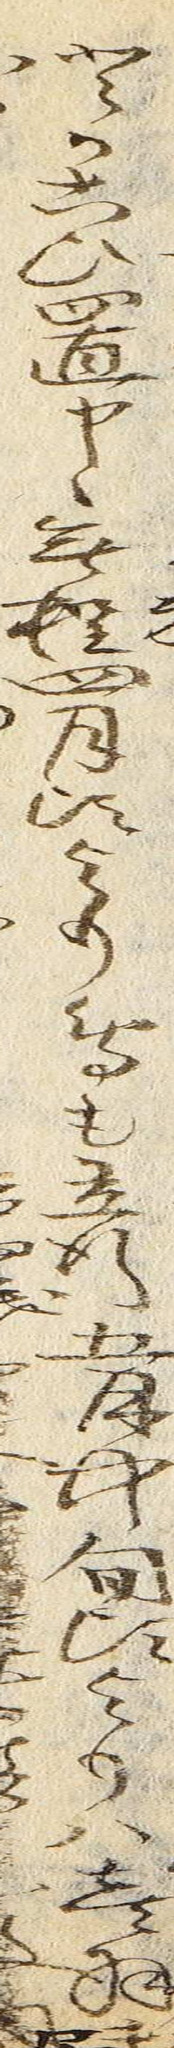とかこひ置申候無程四月頃より鳥も立行五月中旬頃よりハ壱羽も居
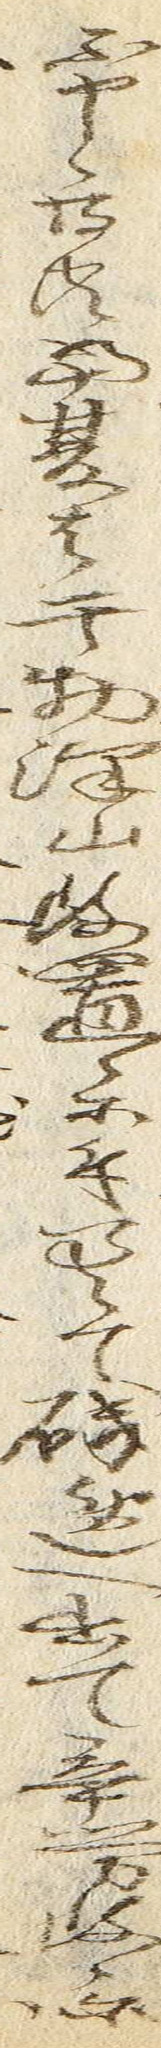不申候得共当夏者干物沢山致置候に付差て磯辺へ出て辛労致候に
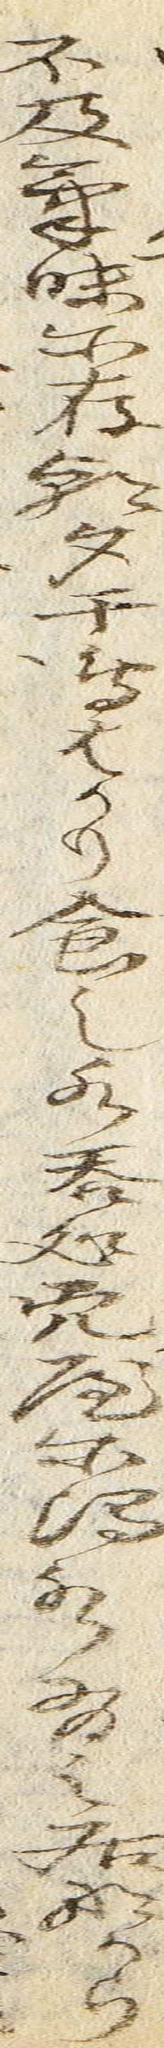不及気味に存朝夕干鳥はかり食し水呑処穴屋に渇水有之居なから
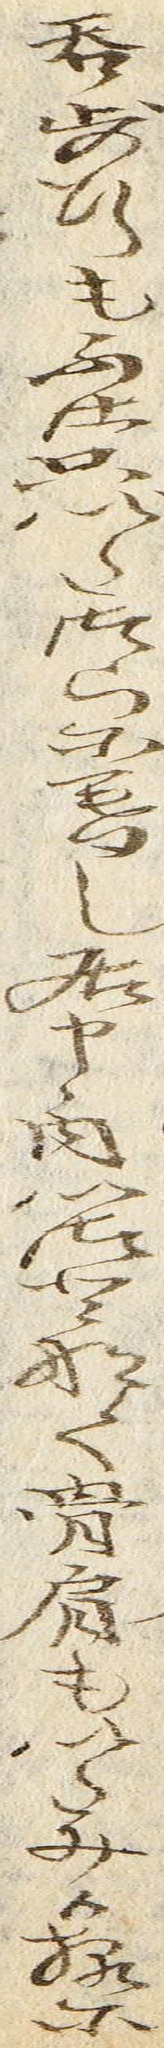呑歩行も不仕只いたつらに暮し居申候内いつとなく骨肩もいたみ候様に
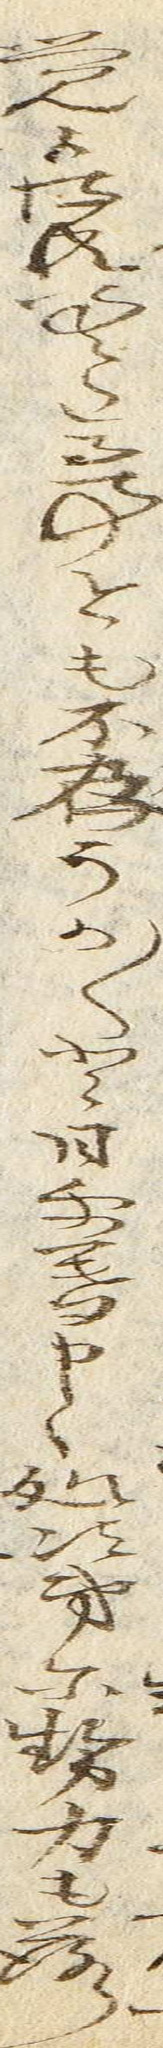覚候得共差たる事とも不存うか〳〵と日を暮申候処次第に勢力も落
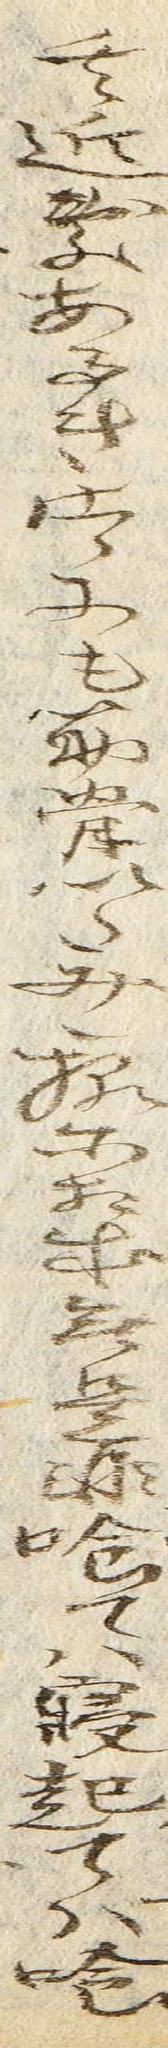其近処あるき仕候にも筋骨いたみ候様に相成無是非喰てハ寝起てハ喰
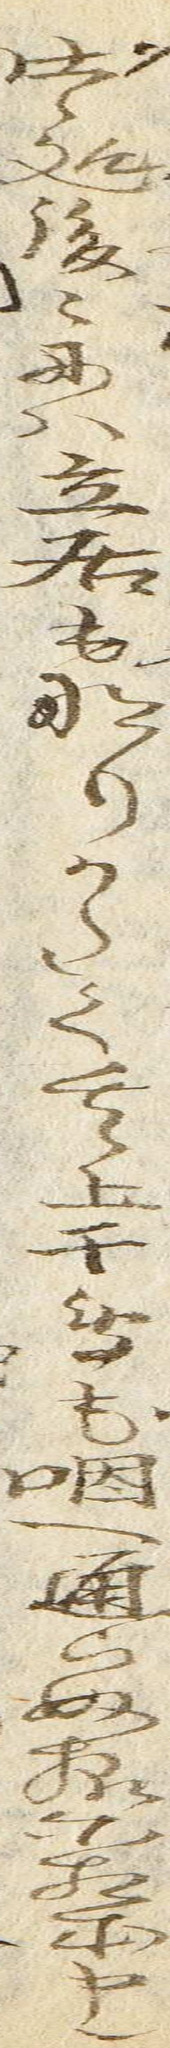仕候処後々にハ立居もなりかたく其上干鳥も咽へ通らぬ様に相成申候
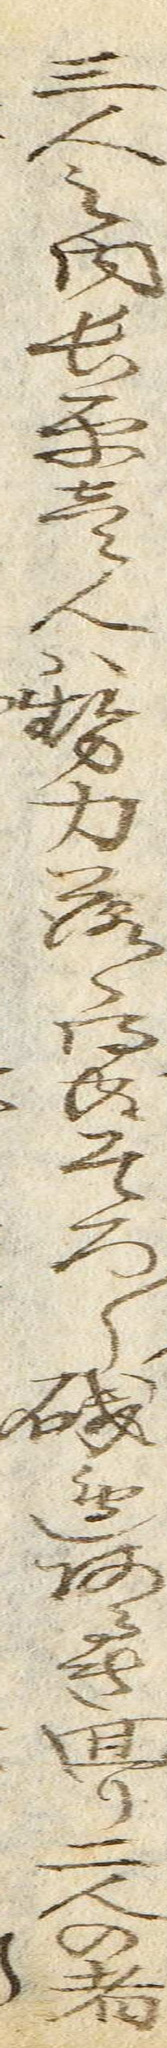三人之内長平壱人ハ勢力落候得共そろ〳〵磯辺あるき回り二人の者
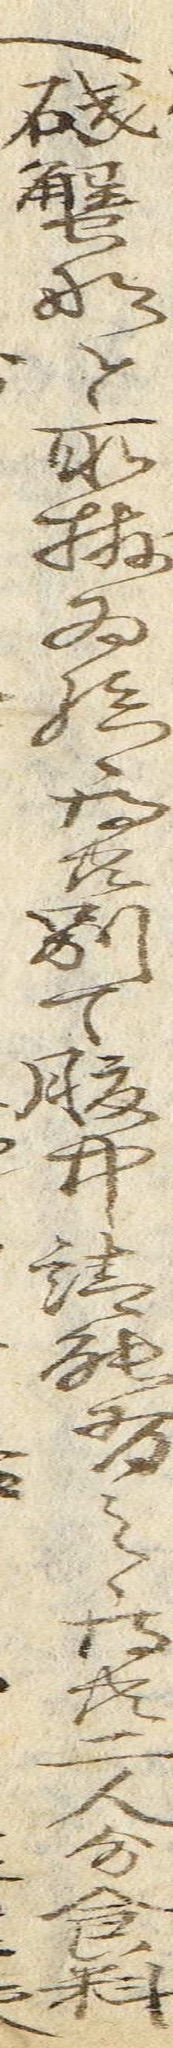へ磯蟹なと取拵為給候得共別て腹中請能有之候得共二人分食料
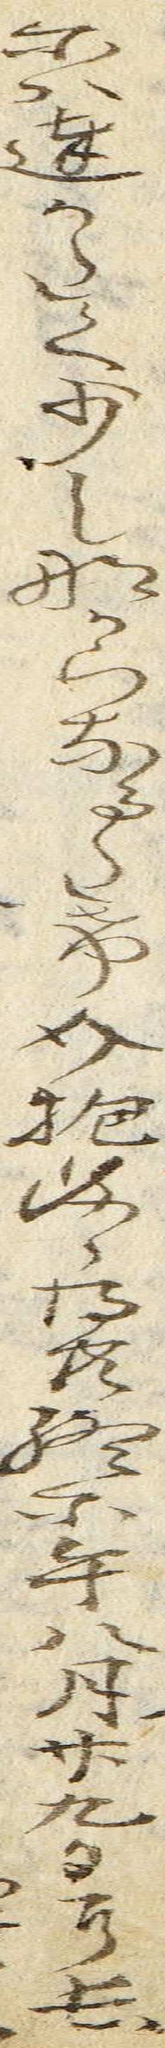にハ達かたく少しなからなるたけ介抱致候得共終に午八月廿九日に長

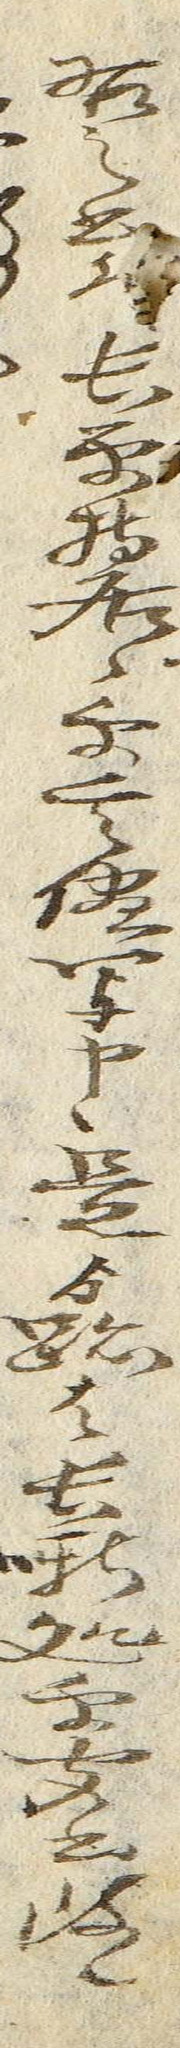右之書付長平持居候を其儘写申候是ゟ跡者長噺処を聞書致候
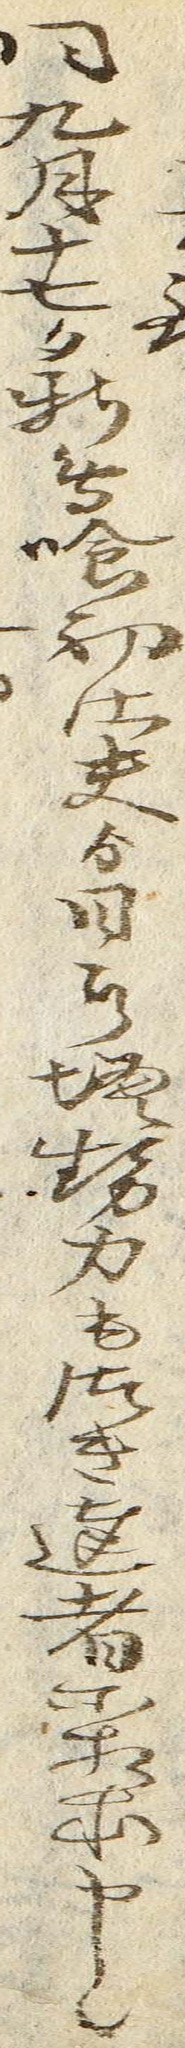一同九月十七日新鳥喰初仕夫ゟ日に増勢力もつき達者に相成申候
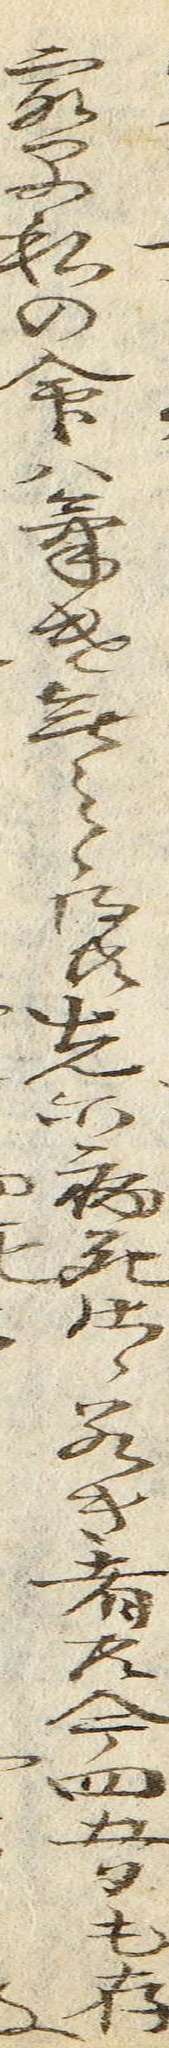最早私の命ハ気遣無之候得共先に病死仕候若き者共今四五日も存
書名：無人島漂流書付
